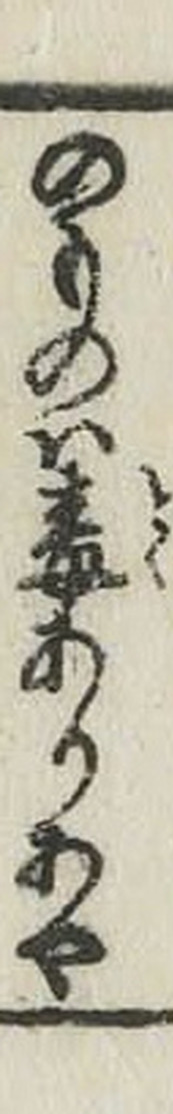のものは毒ありあや
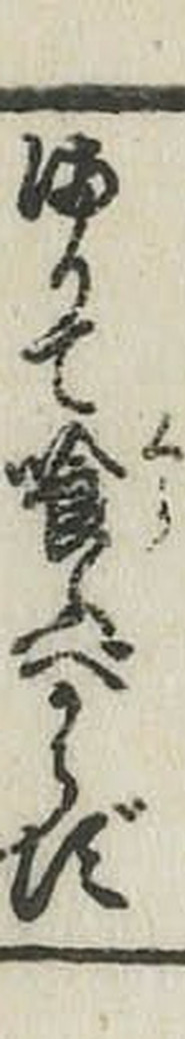まりて喰ふべからず
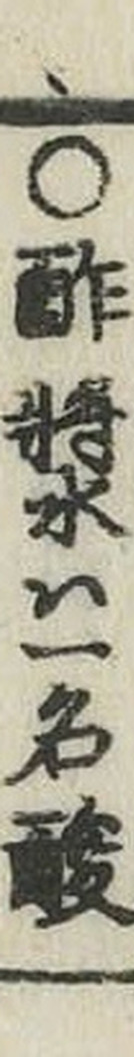○酢漿は一名酸
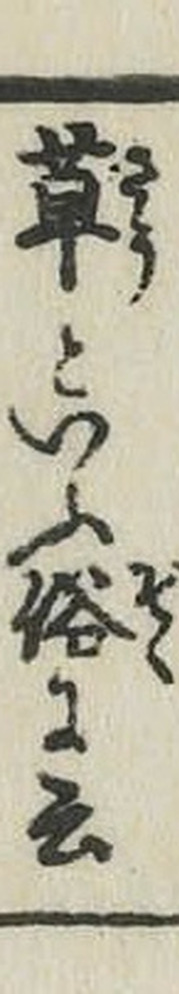草といふ俗に云
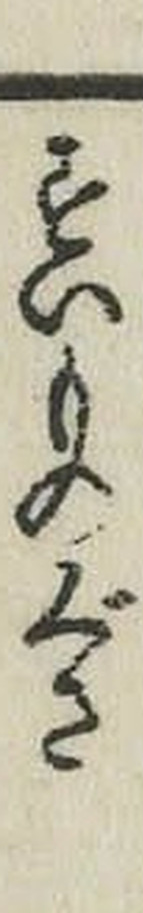すいものぐさ

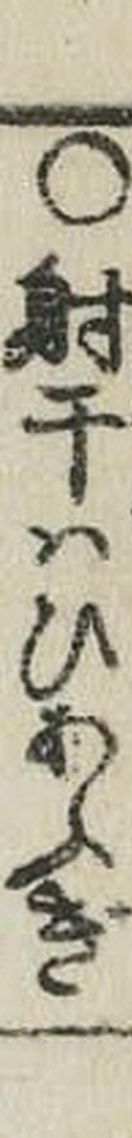○射干はひあふぎ
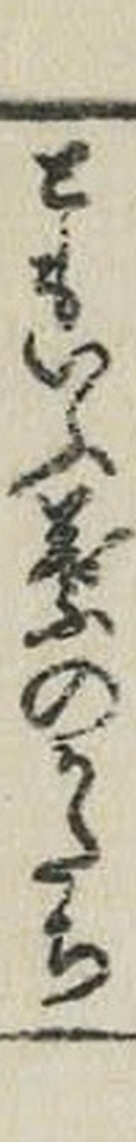ともいふ葉のかたち
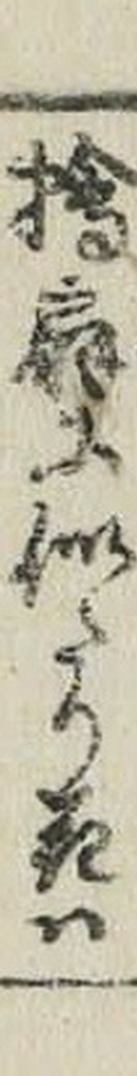檜扇に似たり花は
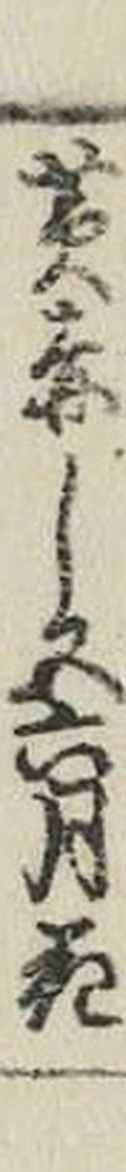黄赤し五六月花
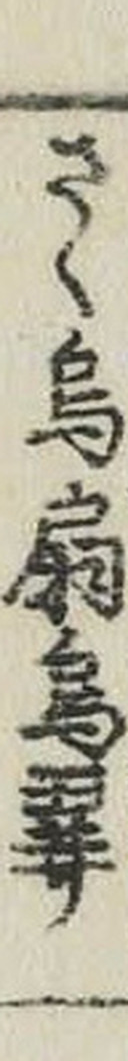さく烏扇烏翣
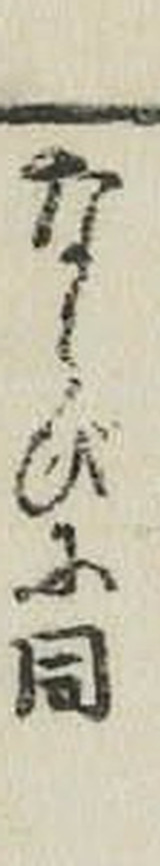ならびに同
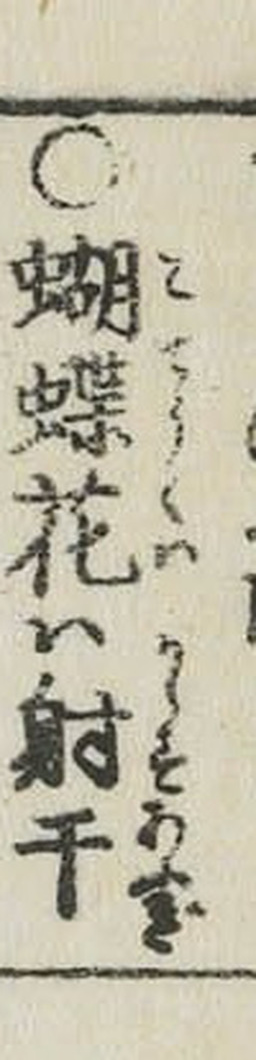○蝴蝶花は射干
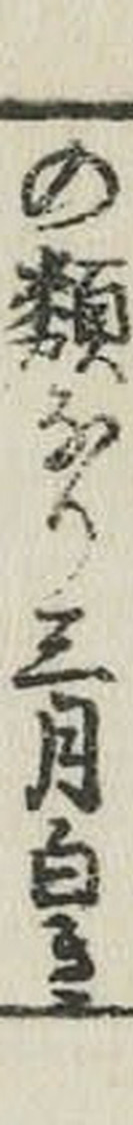の類なり三月白き
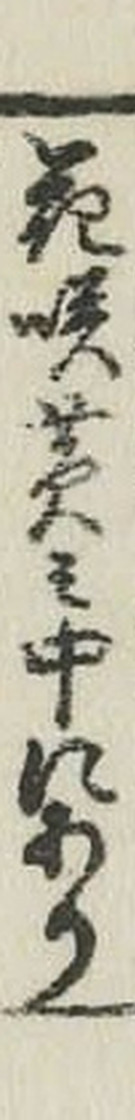花咲黄み中にあり
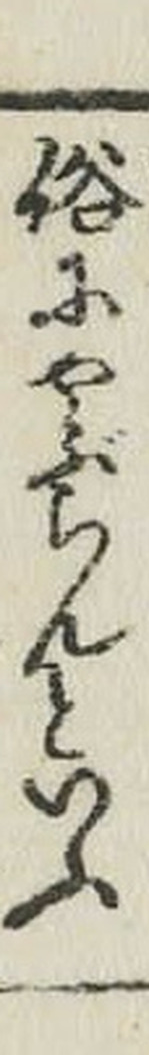俗にやぶらんといふ
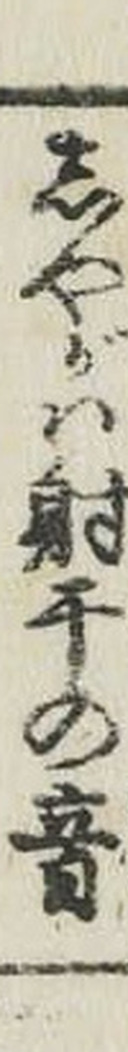しやがは射干の音
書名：増補頭書訓蒙図彙大成 10巻 9:巻之20
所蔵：東京学芸大学教育コンテンツアーカイブ
